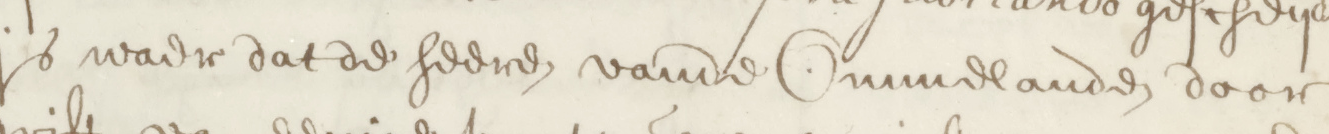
Is waer dat de heeren vande Ommelanden door
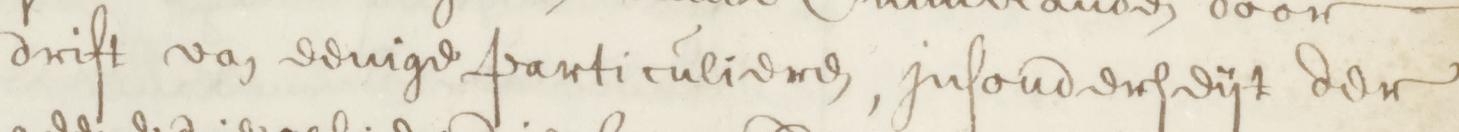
drift van eenige particulieren, insonderheijt der
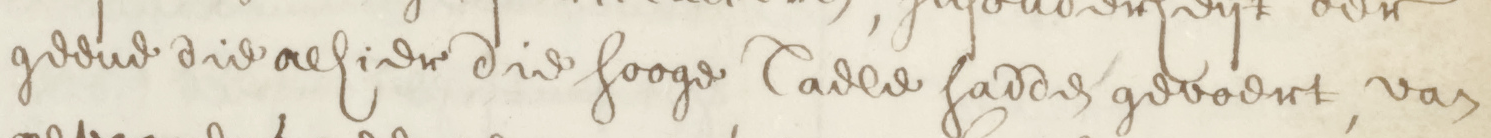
geene die alhier die hooge Taele hadden gevoert, van
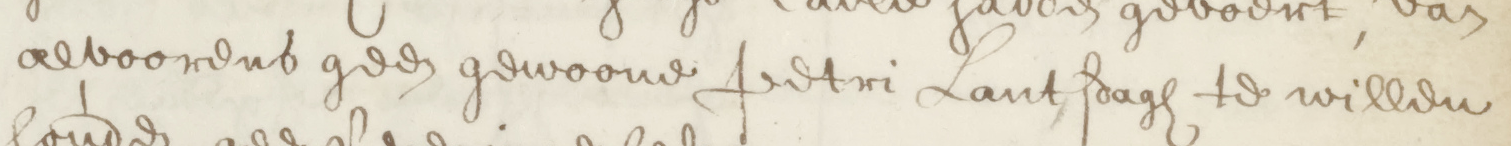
alvoorens geen gewoone Petri Lantsdagh te willen
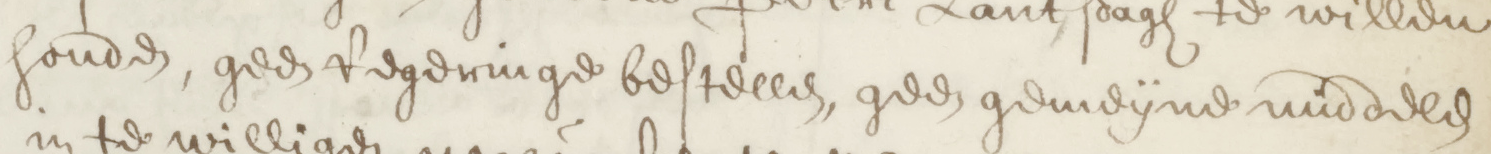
houden, geen Regeringe bestellen, geen gemeijne middelen
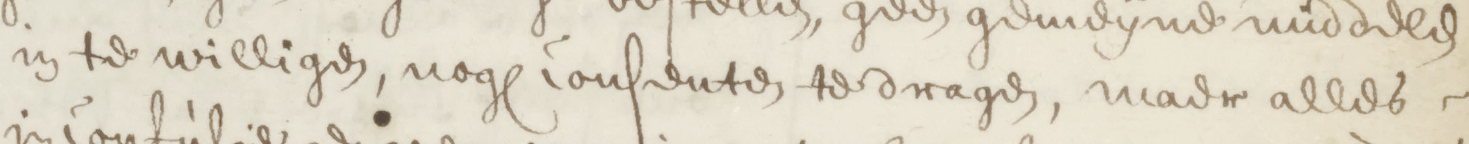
in te willigen, nogh consenten te dragen, maer alles
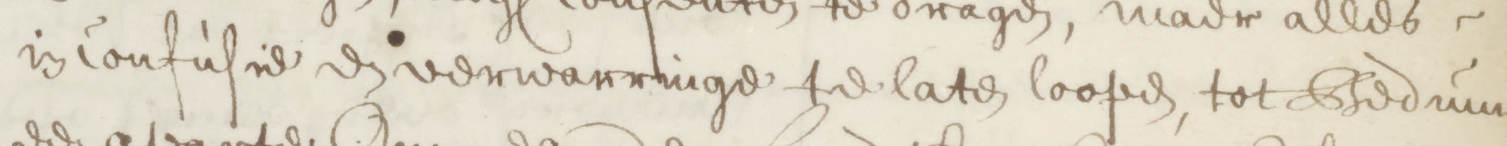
in Confusie en verwarringe te laten loopen, tot Bedum
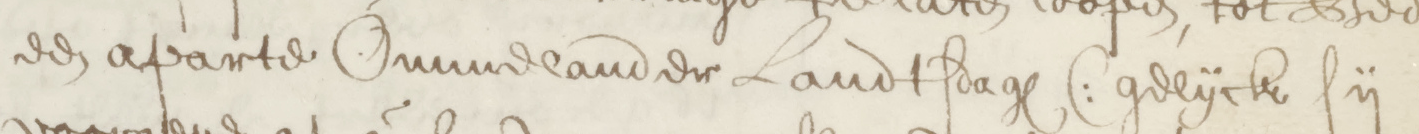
een aparte Ommelander Landtsdagh (:gelijck sij
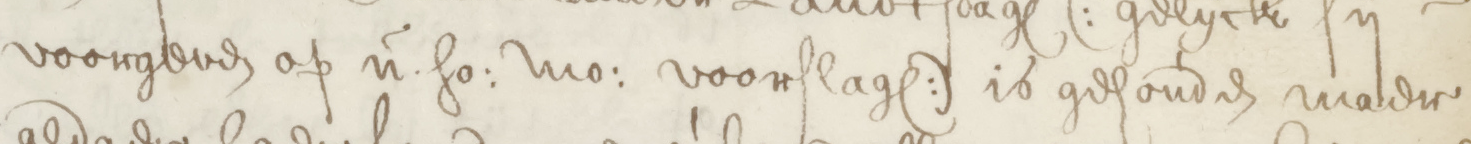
voorgeven op u. ho:Mo: voorslagh:) is gehouden maer
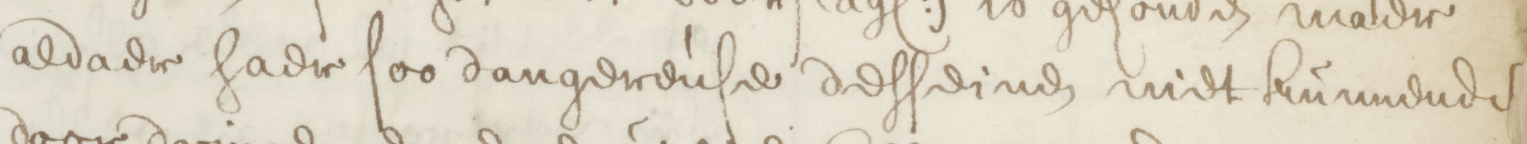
aldaer haer soo dangereuse desseinen niet kunnende
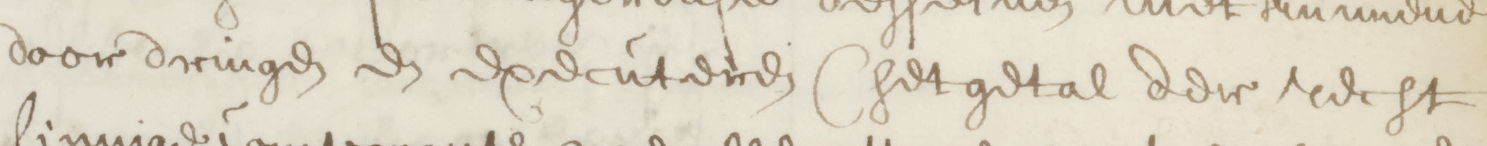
door dringen en executeren (het getal der recht
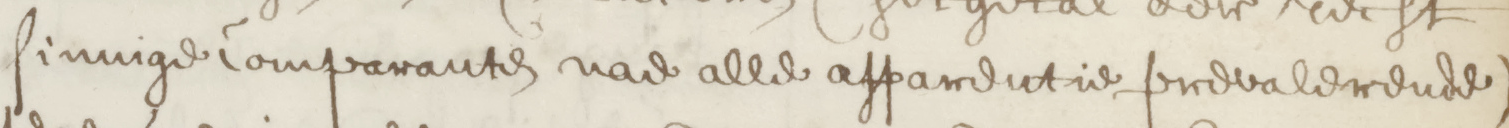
„sinninge Comparanten nae alle apparentie prevalerende)
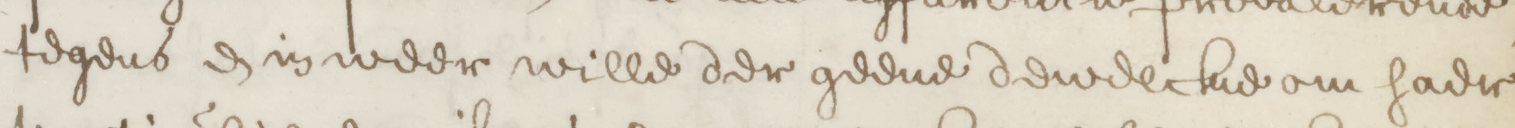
tegens en in weer wille der geene dewelcke om haer
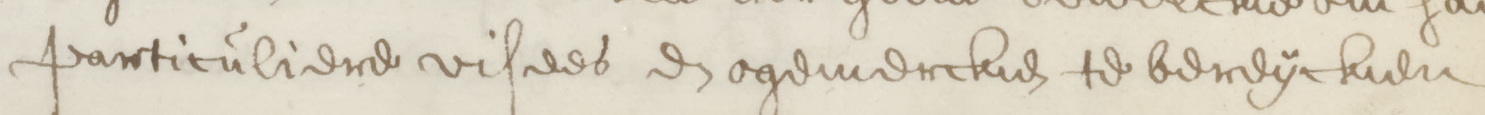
particuliere visees en ogemercken te bereijcken
